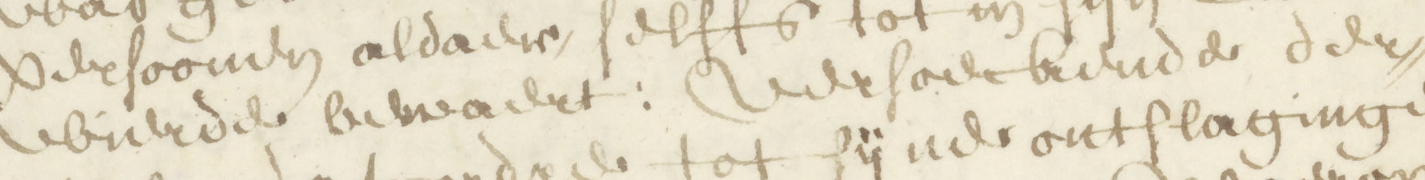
wierde bewaert: versoeckende der„
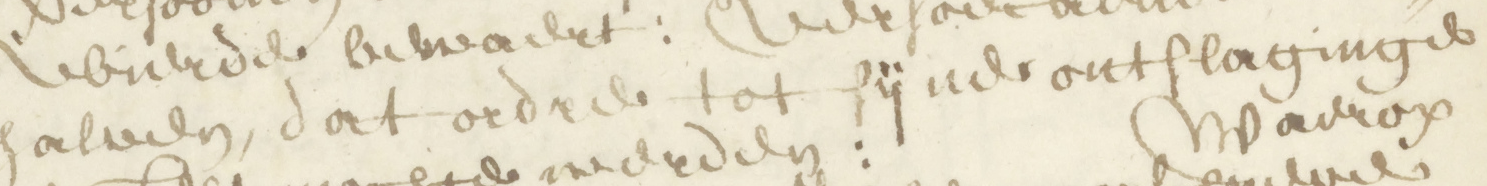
halven, dat ordre tot sijne ontslaginge
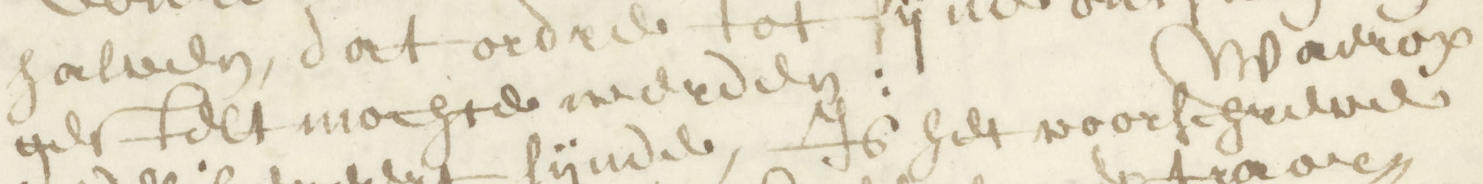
gestelt mochte werden: Waerop
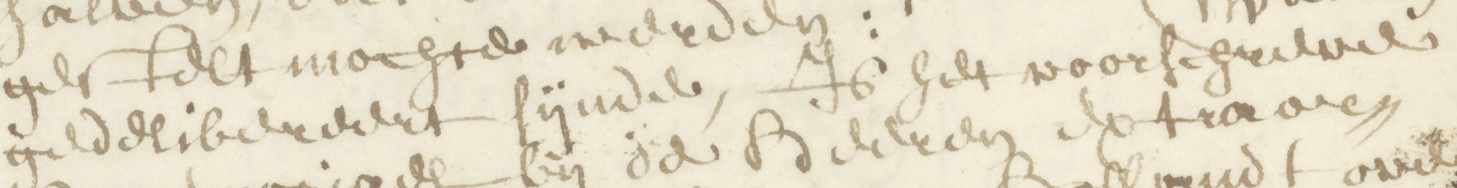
gedelibereert sijnde, Is het voorschreve
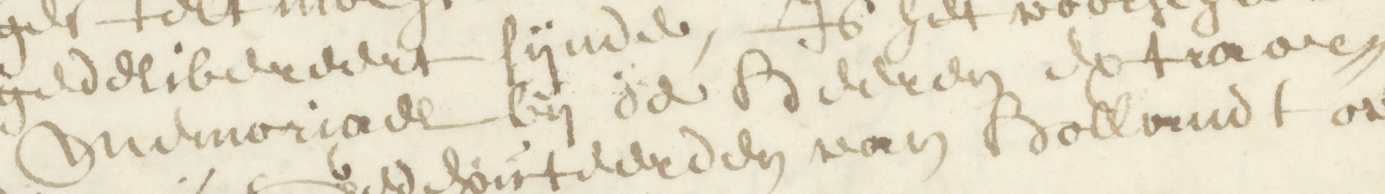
memoriael bij de Heeren Extraor„
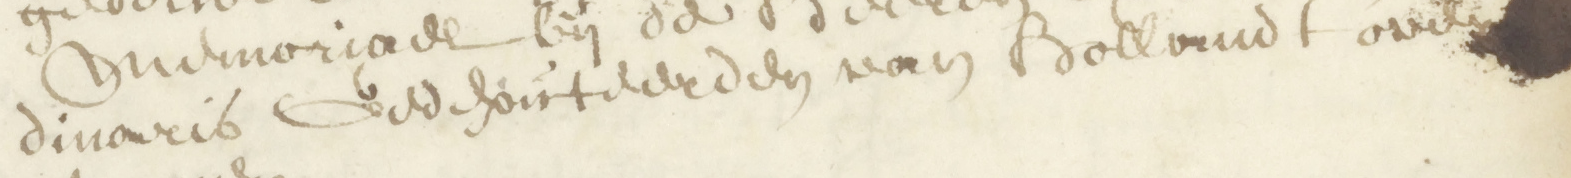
dinaris Gedeputeerden van Hollandt over
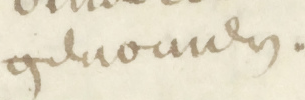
genomen.
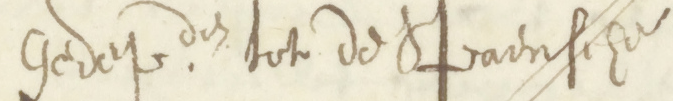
Gedepden. tot de Spaensche
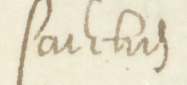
saecken
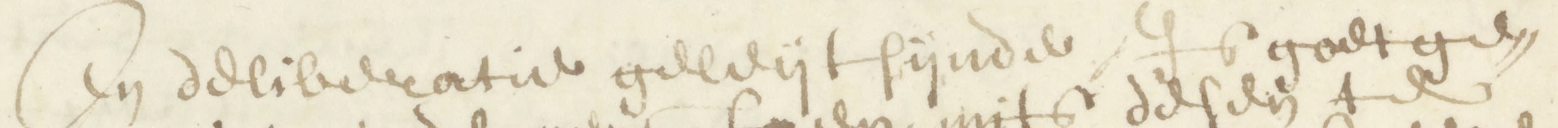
In deliberatie geleijt sijnde, Is goetge„
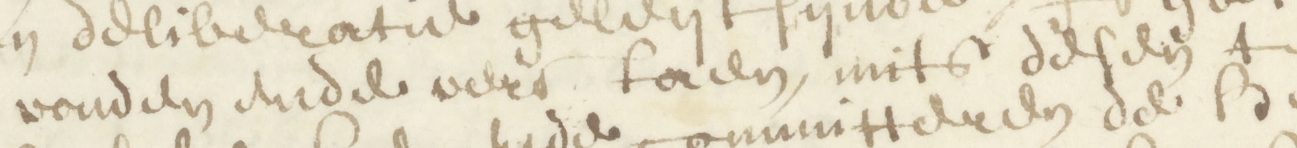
vonden ende verstaen, mits desen te
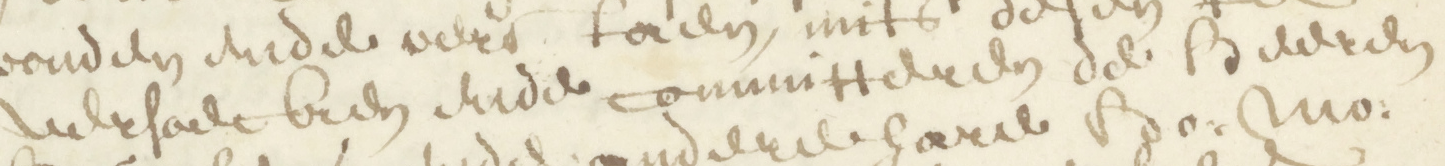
versoecken ende committeren de Heeren
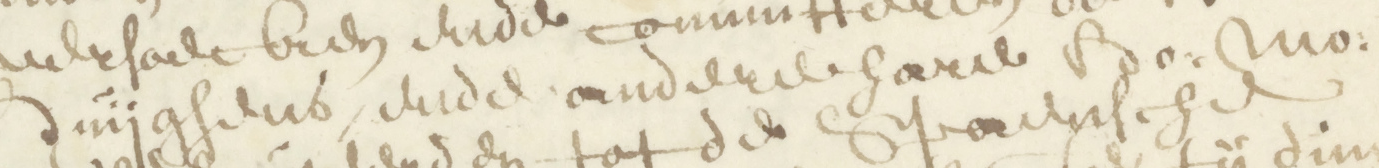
Huijghens, ende andere hare Ho:Mo:
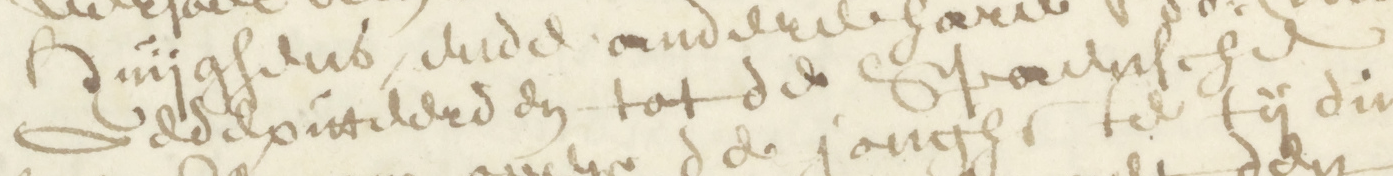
Gedeputeerden tot de Spaensche
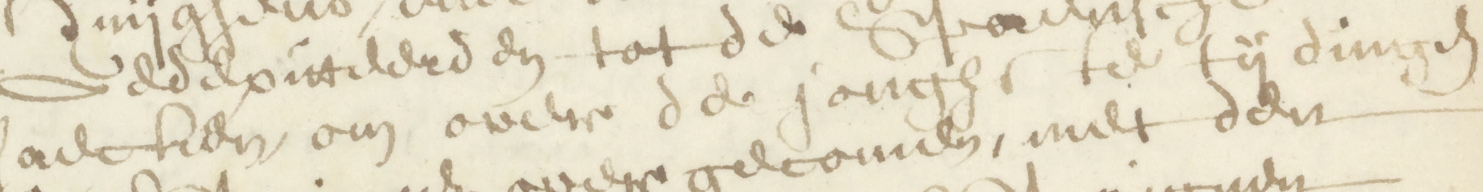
saecken, om over de jonghste tijdingen
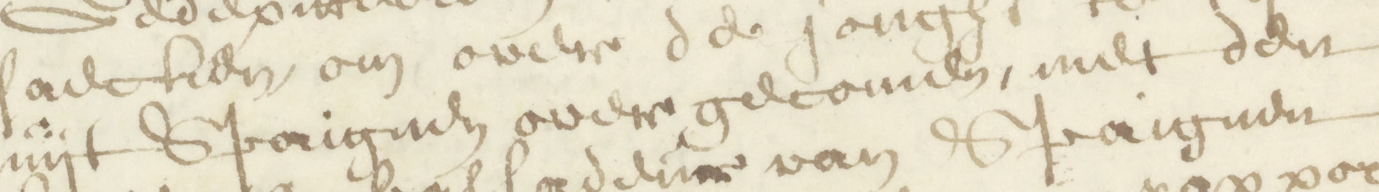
uijt Spaignen over gecomen, met den
